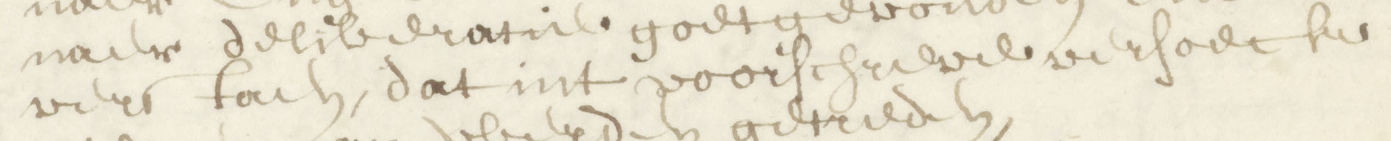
verstaen, dat int voorschreve versoecke
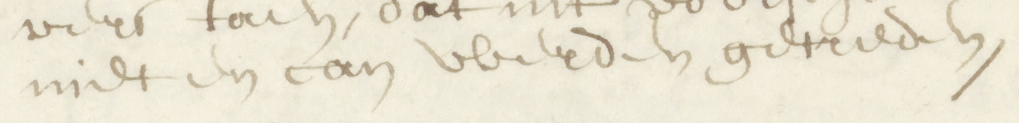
niet en can werden getreden
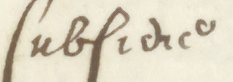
subsidie
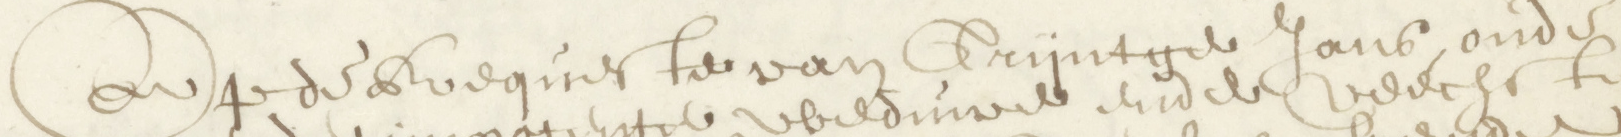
Opde Requeste van Trijntge Jans oude
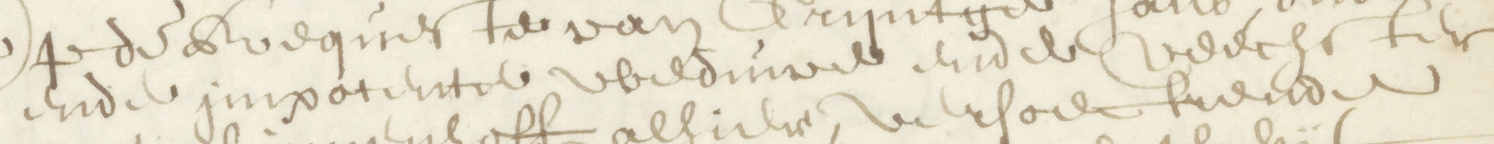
ende impotente weduwe ende Veechster
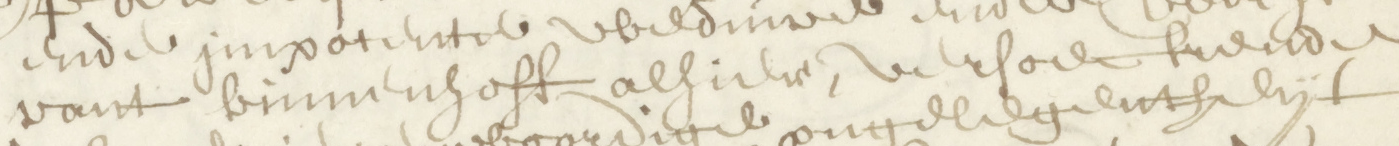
vant binnenhoff alhier, versoeckende
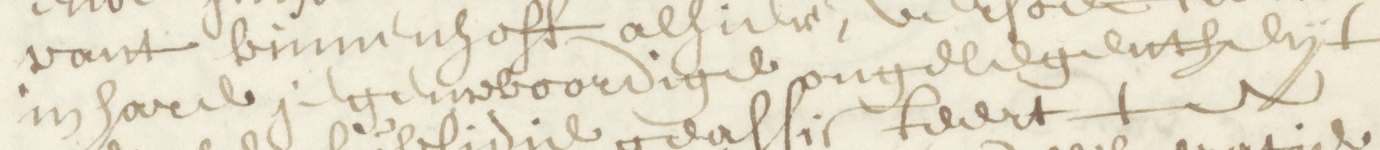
in hare jegenwoordige ongelegentheijt
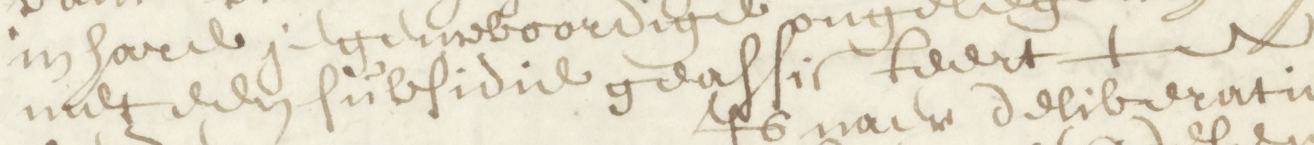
met een subsidie geassisteert te
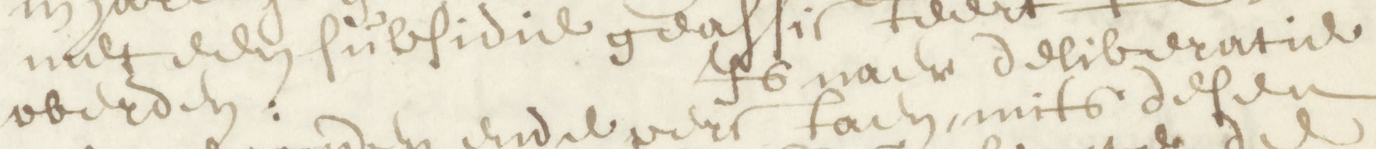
werden: Is naer deliberatie
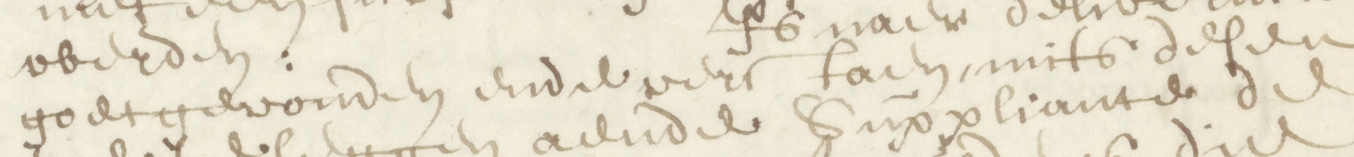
goetgevonden ende verstaen, mits desen
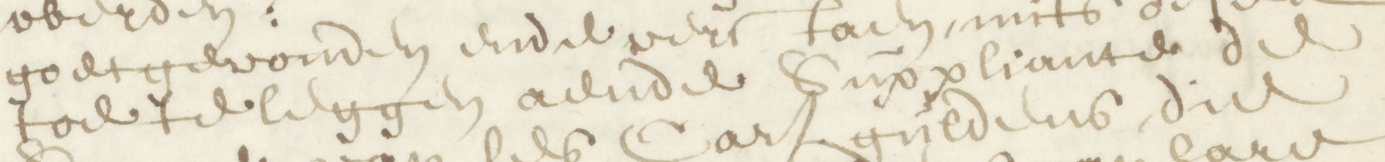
toe te leggen aende Suppliante de
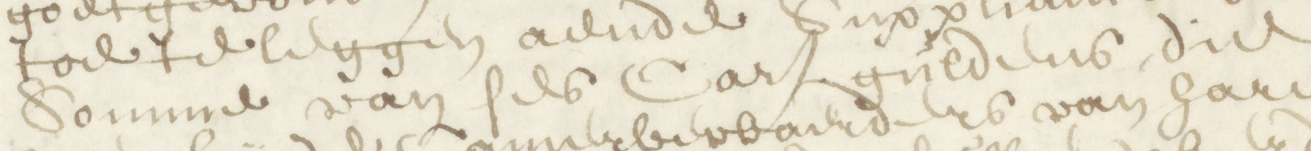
somme van ses Cars guldens, die
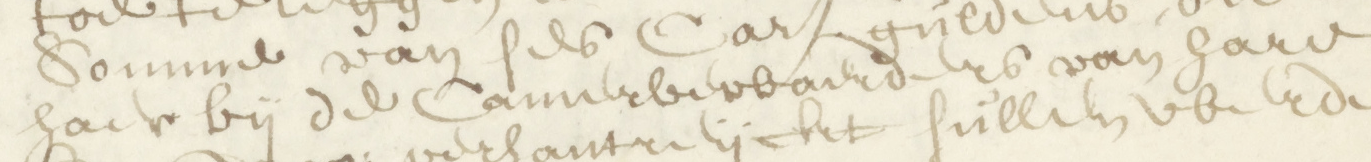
haer bij de Camerbewaerders van hare
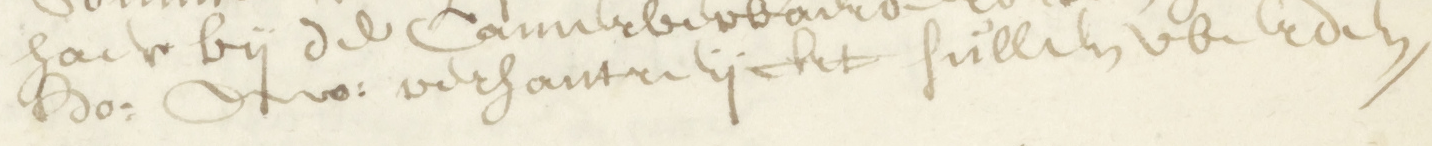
ho:Mo: verhantreijckt sullen werden.
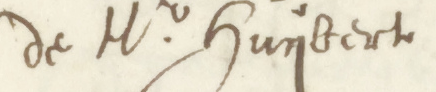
de Hr. Huijbert
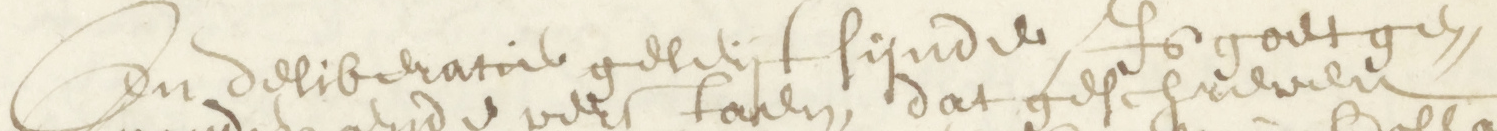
In deliberatie geleijt sijnde, is goetge,,
